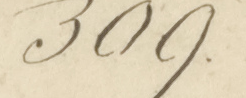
309.
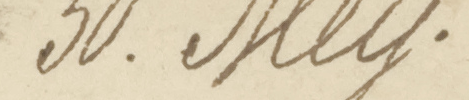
30. Meij.
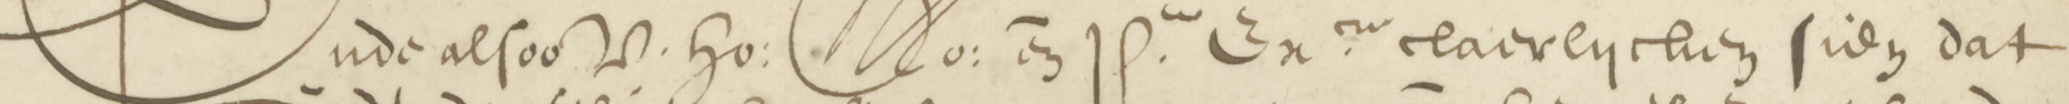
Ende alsoo U. ho:Mo: en Pe. Excie. claerlycken sien dat
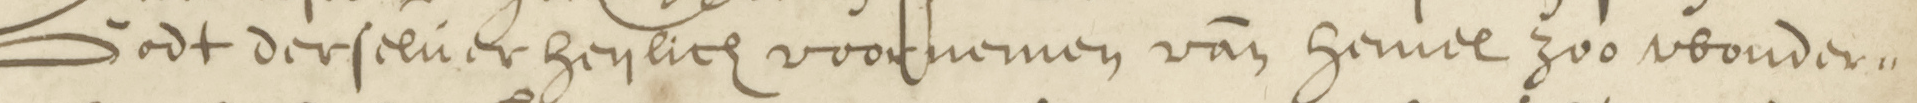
Godt derselver heylich voornemen van hemel zoo wonder„
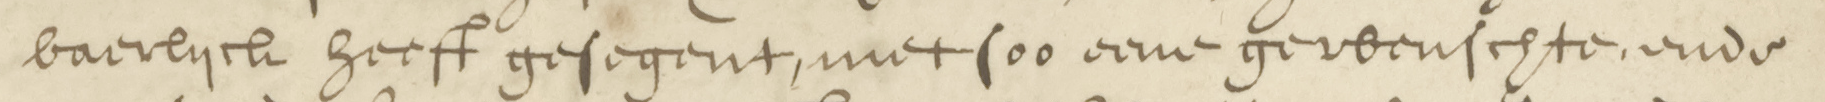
„baerlyck heeft gesegent, met soo eene gewenschte, ende
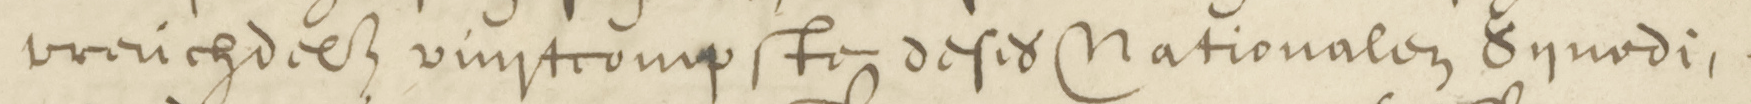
vreuchdel vuytcompste deses Nationalen Synodi,
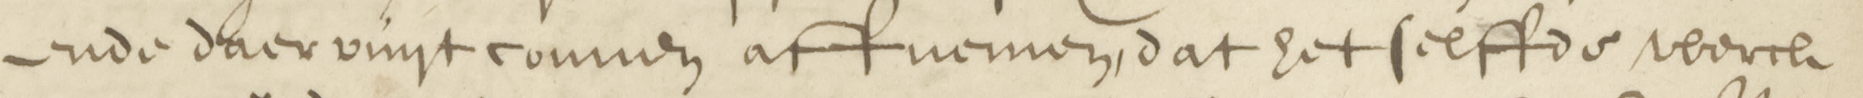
ende daer vuyt connen affnemen, dat het selffde werck
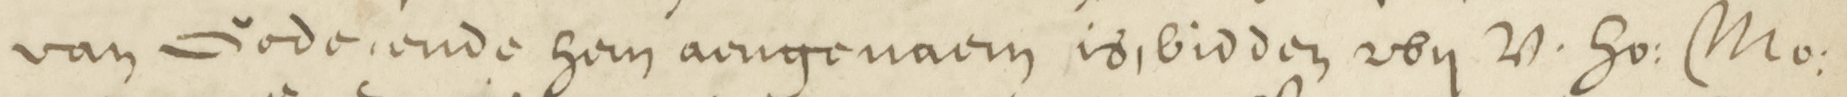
van Gode, ende hem aengenaem is, bidden wy U. ho:Mo:
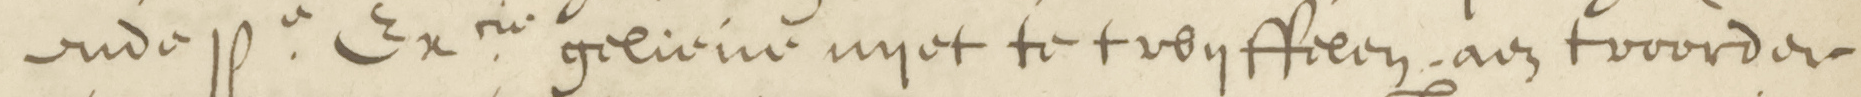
ende Pe. Excie. gelieue nyet te twyffelen, aen tvoorder
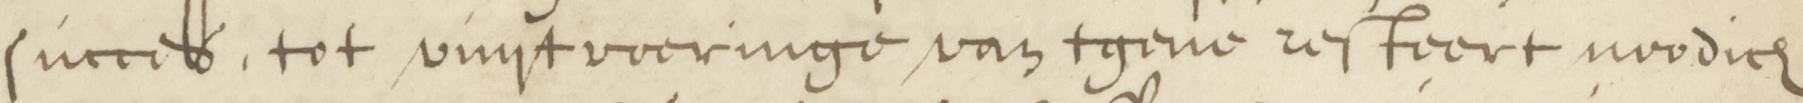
succes, tot vuytvoeringe van tgene resteert noodich
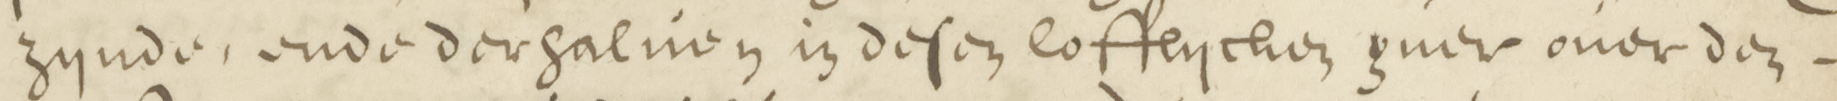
zynde, ende derhaluen in desen lofflycken yuer ouer den
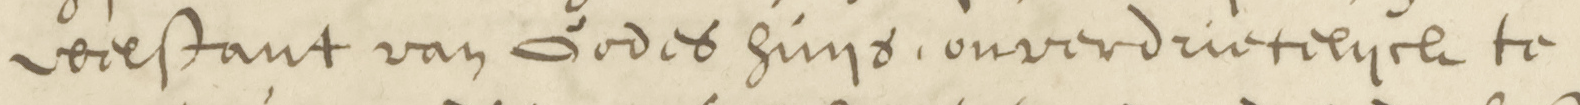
welstant van Godes huys, onverdrietelyck te
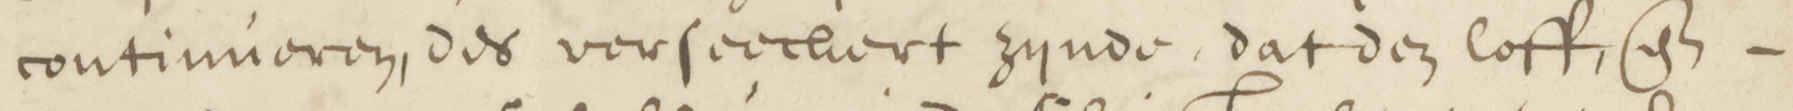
continueren, des verseeckert zynde, dat den loff, &
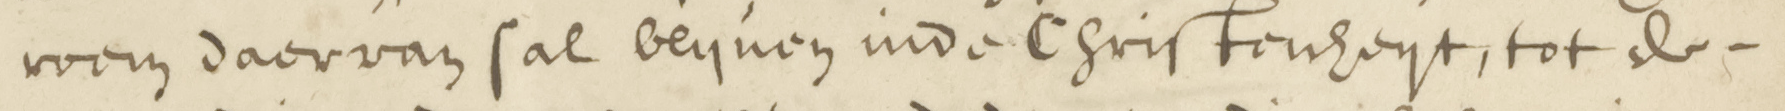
roem daervan sal blyuen inde Christenheyt, tot de
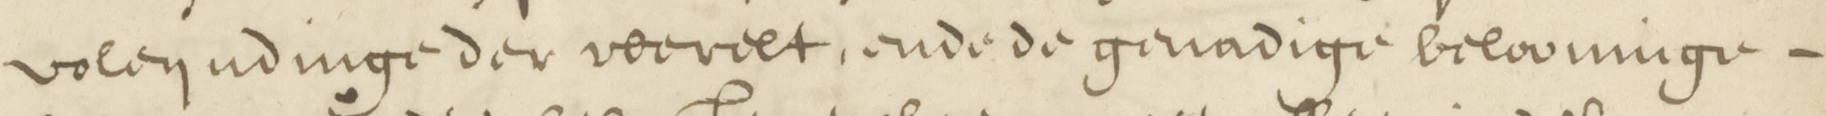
voleyndinge der werelt, ende de genadige belooninge
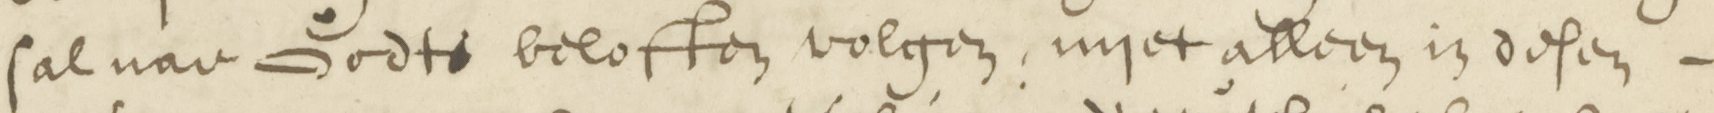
sal nae Godts beloften volgen, nyet alleen in desen
